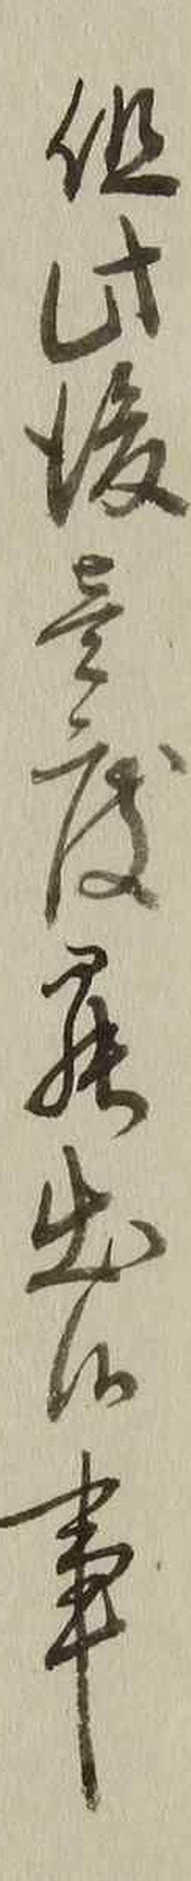但此後壱度罷出候事
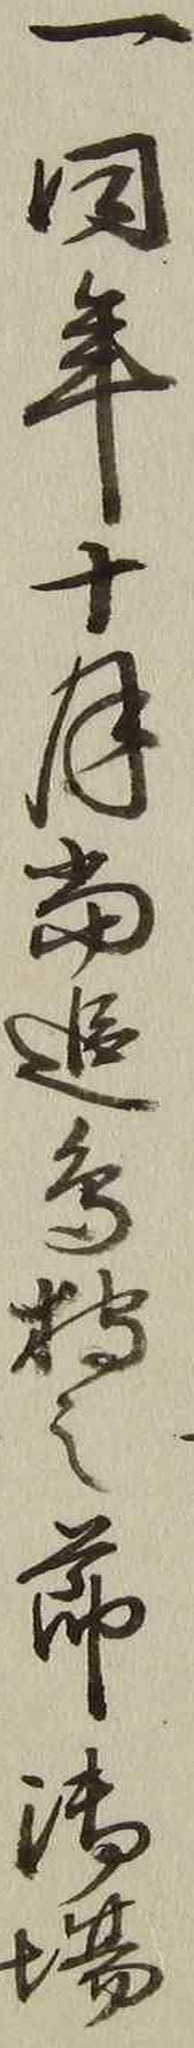一同年十月当追鳥狩之節御場
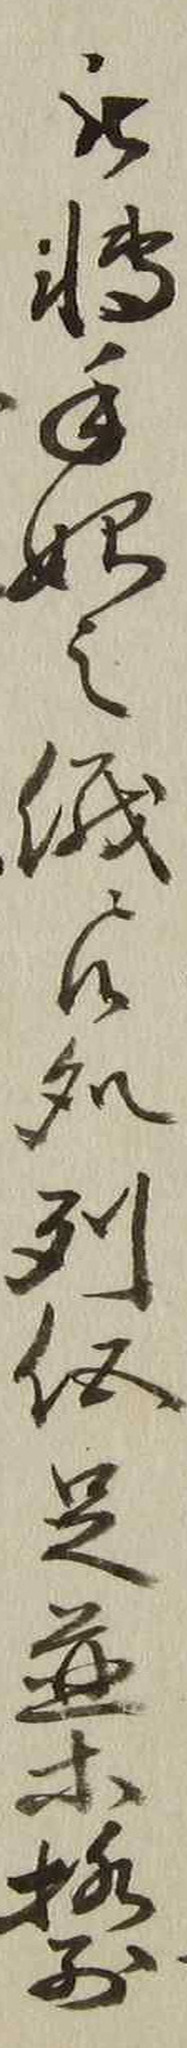被転年始之儀ニ候処列伍足並等格別
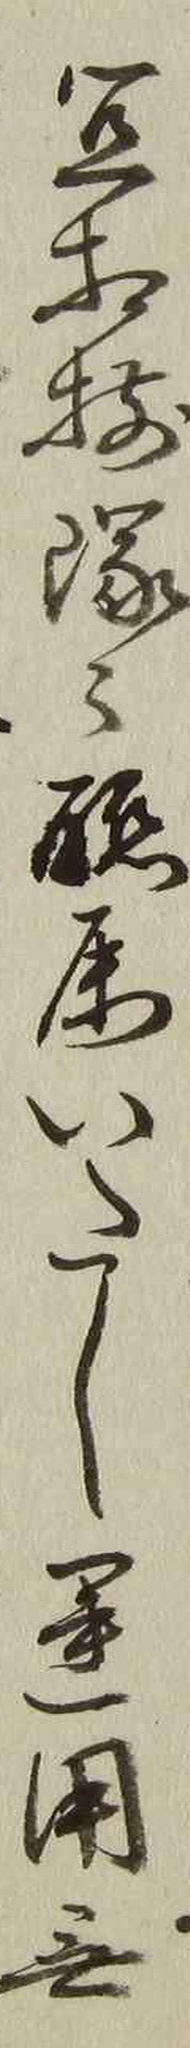宜相揃隊々聯属いたし運用無
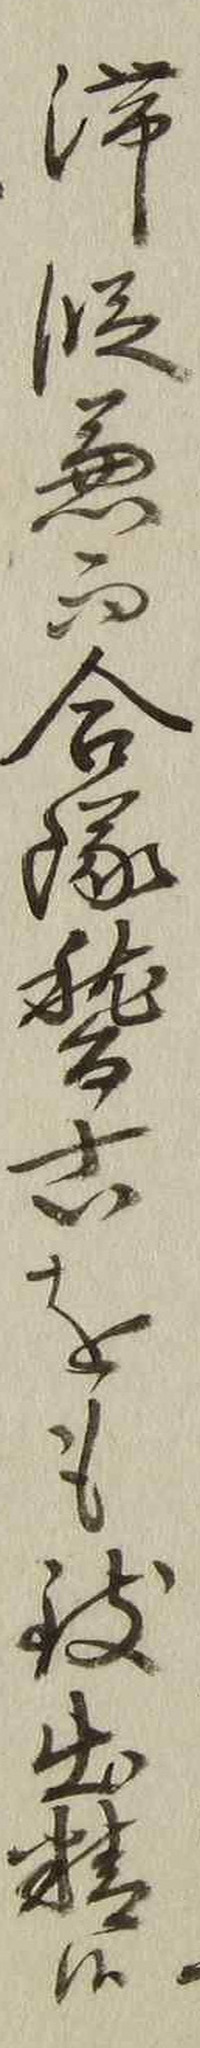滞段兼而合隊稽古をも致出精候
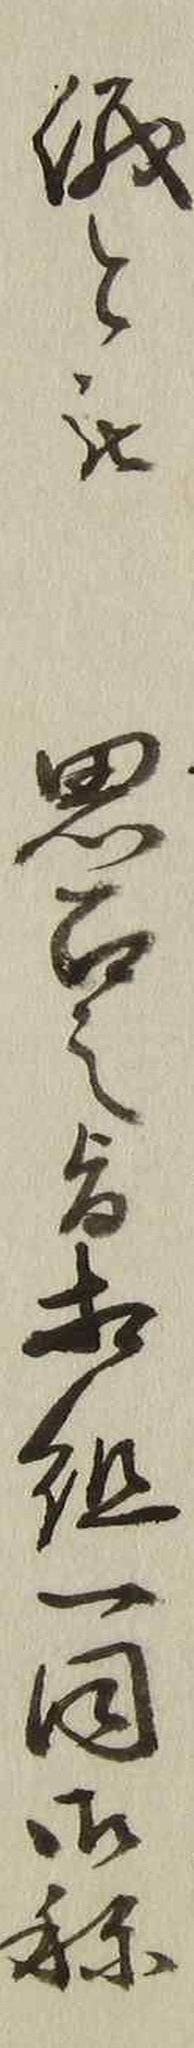儀と被思召之旨相組一同御称
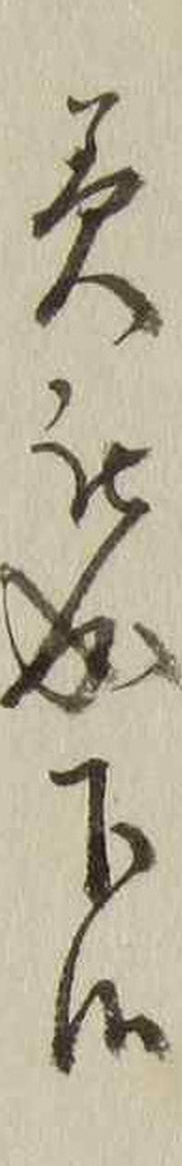美被成下候
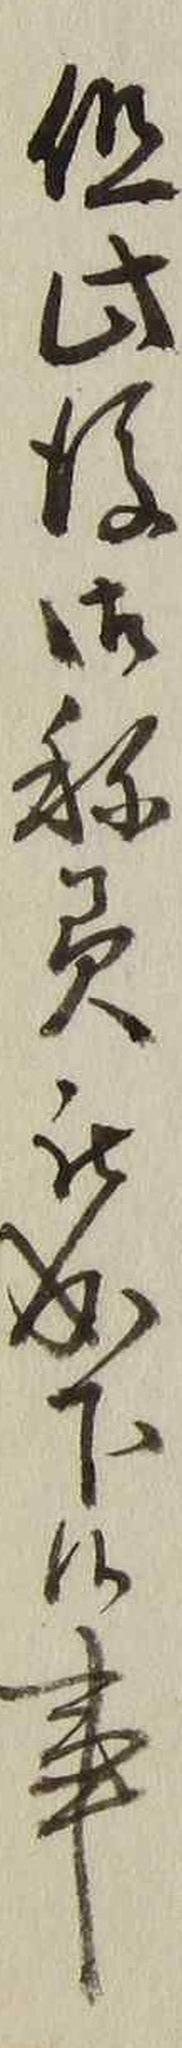但此後御称美被成下候事
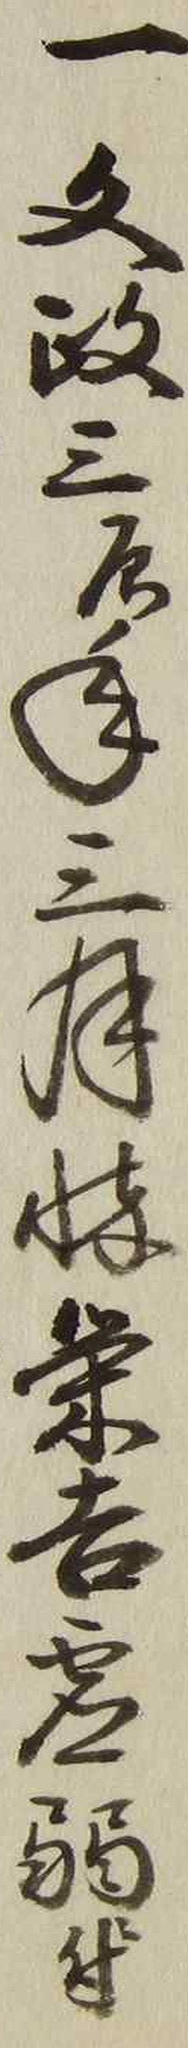一文政三辰年三月悴栄吉虚弱ニ付
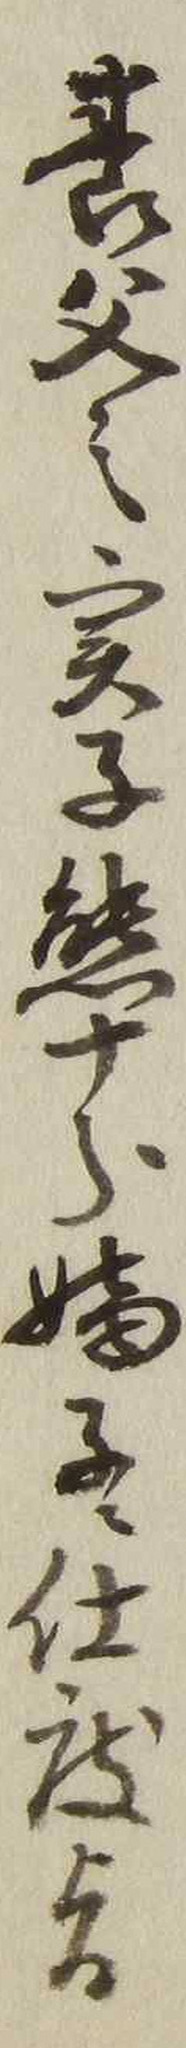養父之実子熊十郎嫡子ニ仕度旨

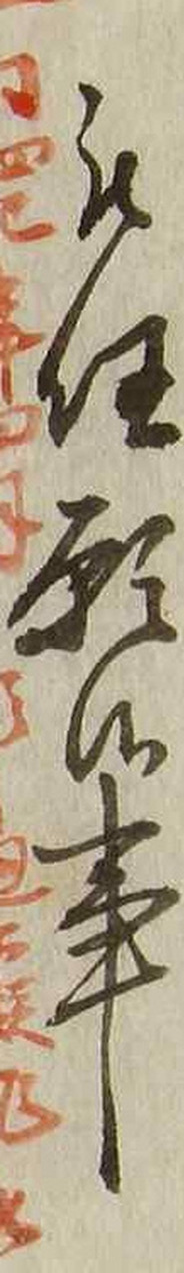被任願候事
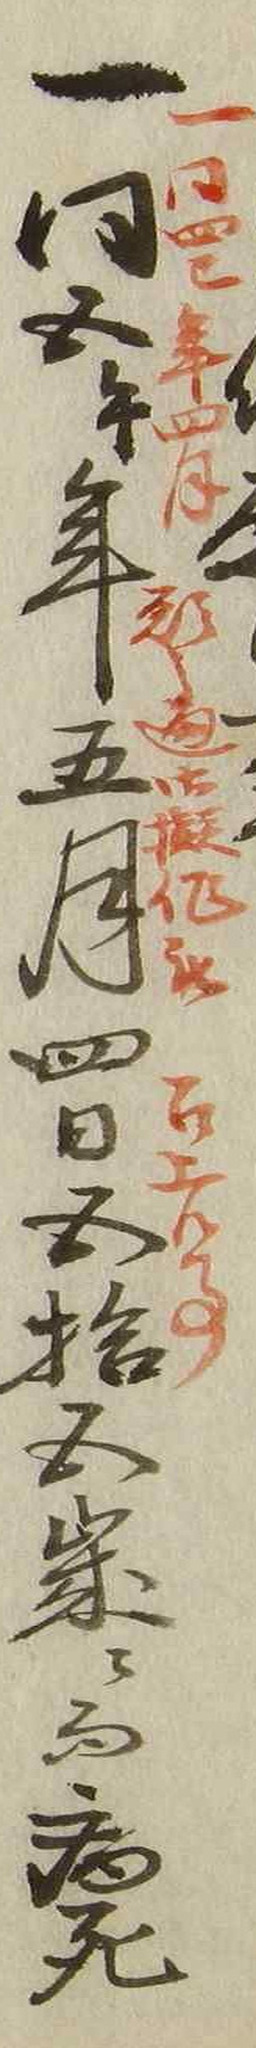一同五午年五月四日五拾五歳ニ而病死
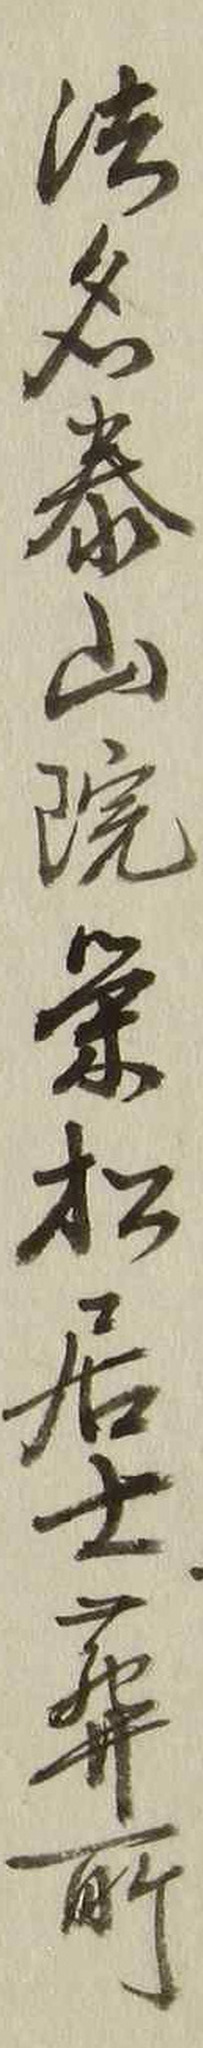法名泰山院栄松居士葬所
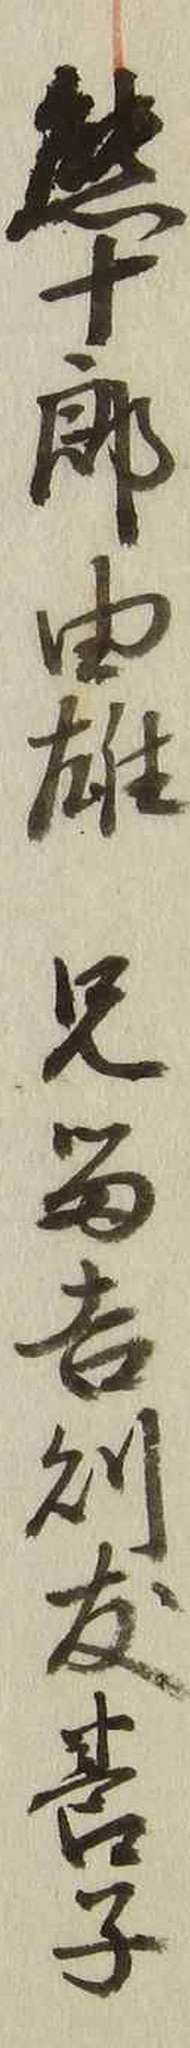熊十郎由雄兄留吉則友養子
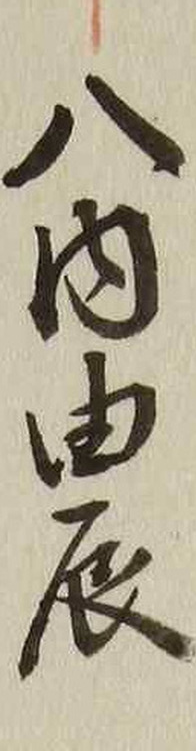八内由辰
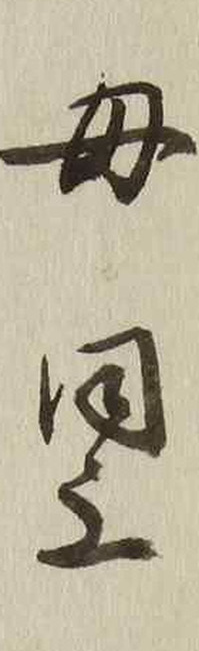母同上
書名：諸士系譜　巻之31　い之部31
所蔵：会津若松市立会津図書館
